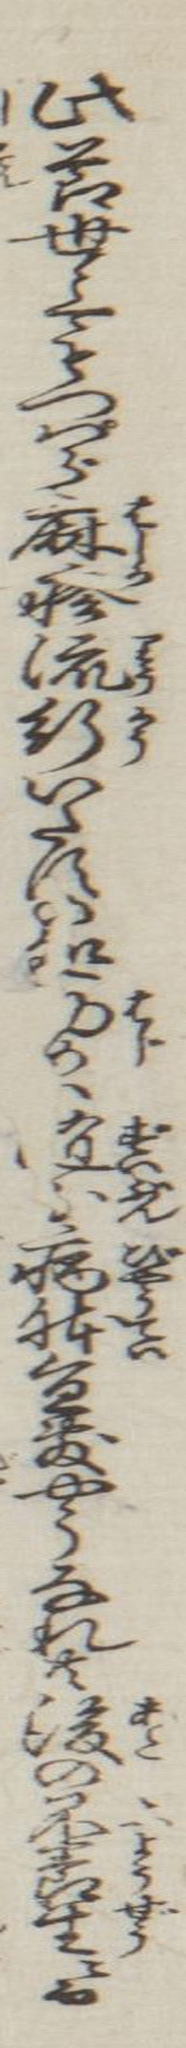此節世上もつぱら麻疹流行いたすの処初めは随分病躰宜敷やうなれ共後の不養生にて
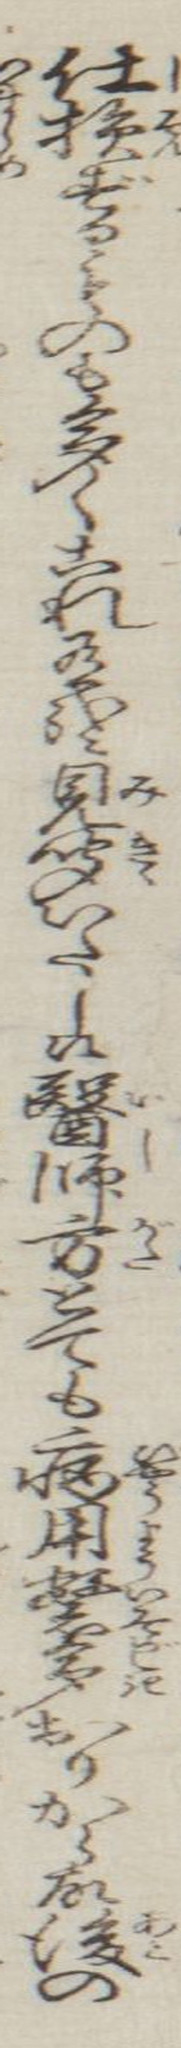仕損ずるものも多くこれ有哉に見聞いたし候医師方とても病用繁多おりから故後の
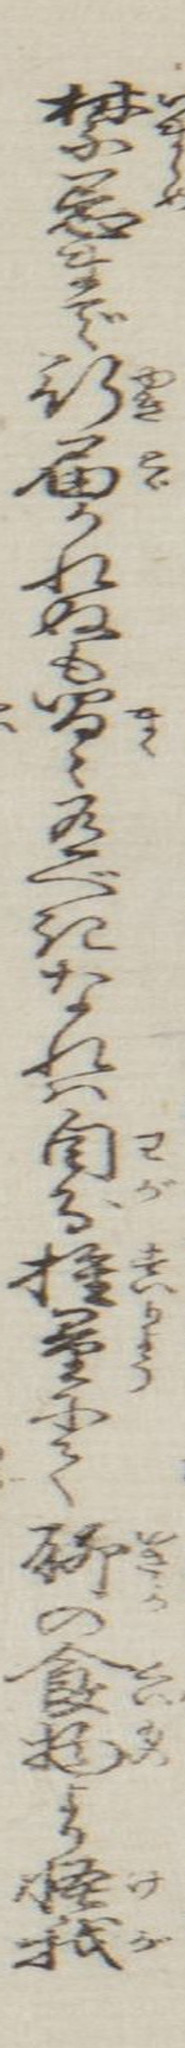禁忌まで行届かれぬも間々有べきなれは自分推量にて聊の食物より怪我
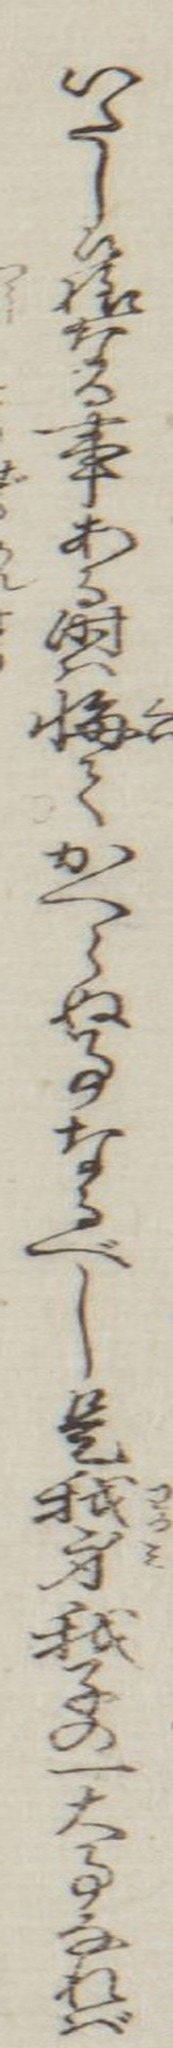いたし候様なる事ある時は悔てかへらぬ事なるべし是我身我子の一大事なれば
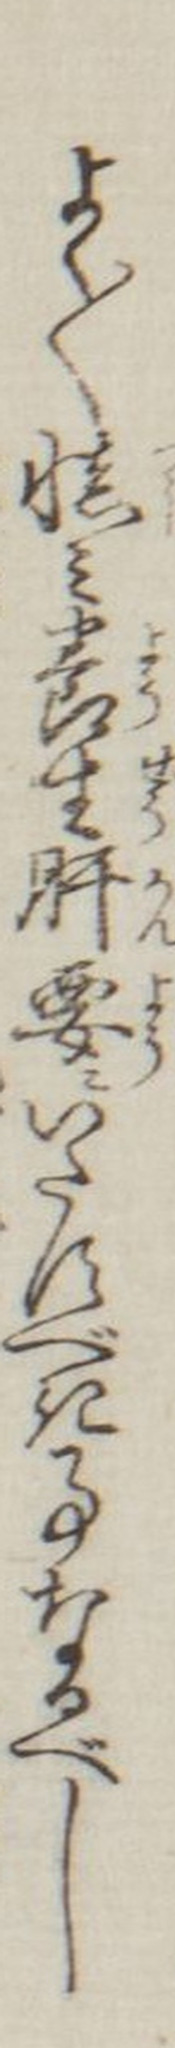よく〳〵慎み養生肝要にいたすべき事なるべし
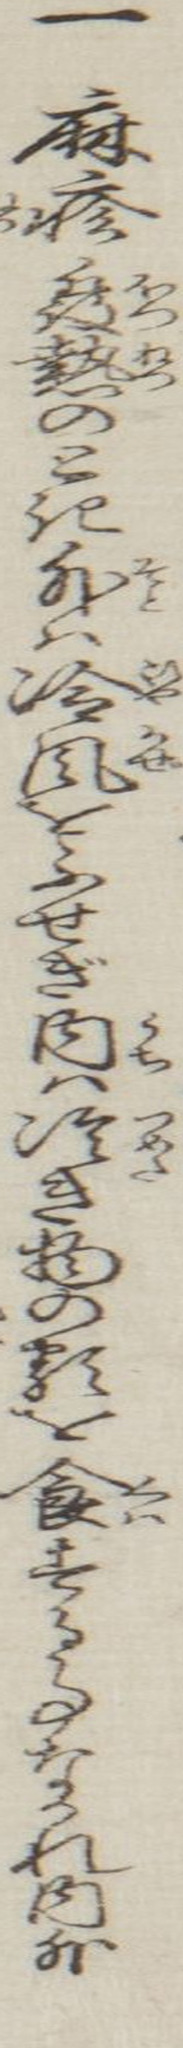一麻疹発熱のとき外は冷風をふせぎ内は冷き物の類を食する事なかれ内外
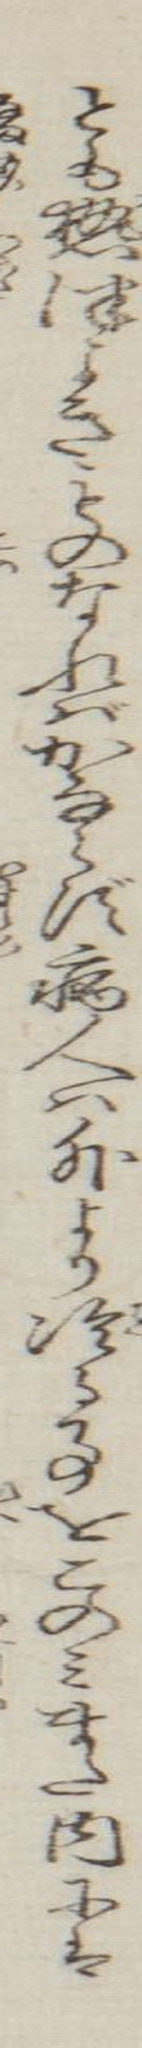とも熱つよきものなればかならず病人は外より冷る事をこのみまた内には
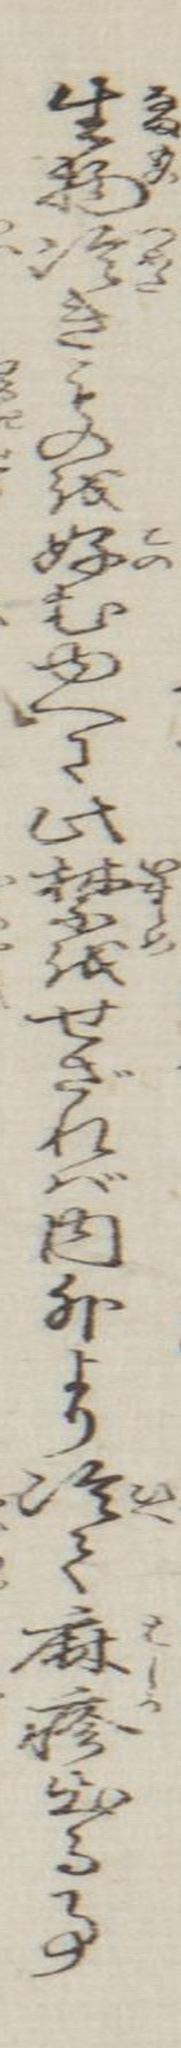生物冷きものを好むゆへに此禁をせざれば内外より冷て麻疹出る事
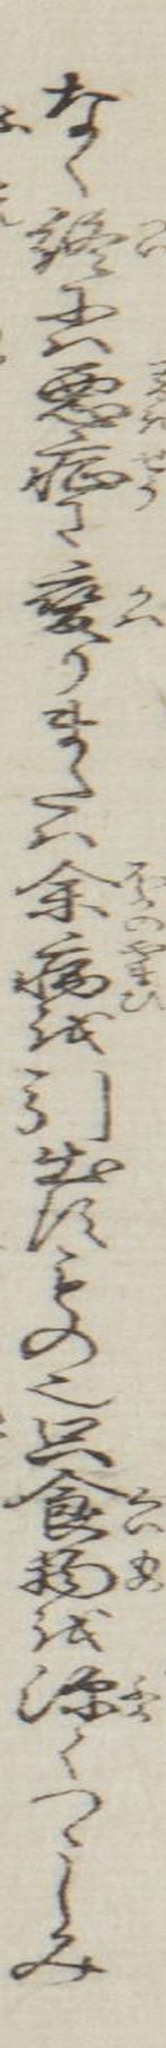なく終には悪症に変りまたは余病を引出もの也只食物を深くつゝしみ
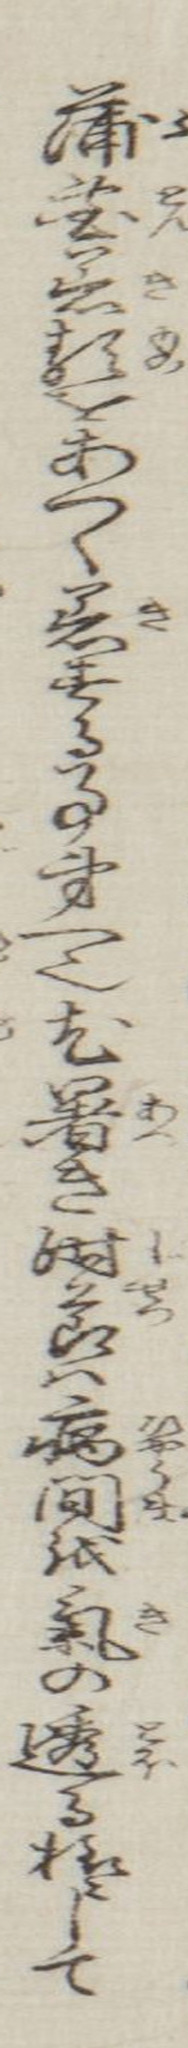蒲団着類をあつく着する事第一也尤暑き時節は病間を気の透る様にして
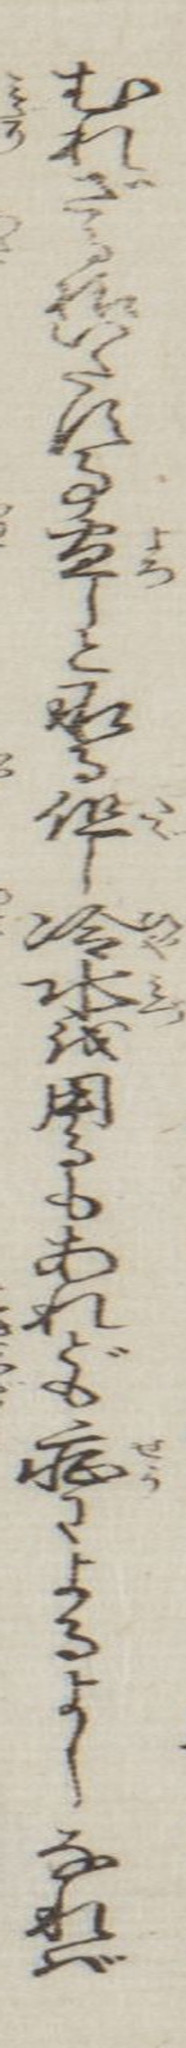むれざる様いたす事宜しと承る但し冷水を用るもあれども症によるよしなれば
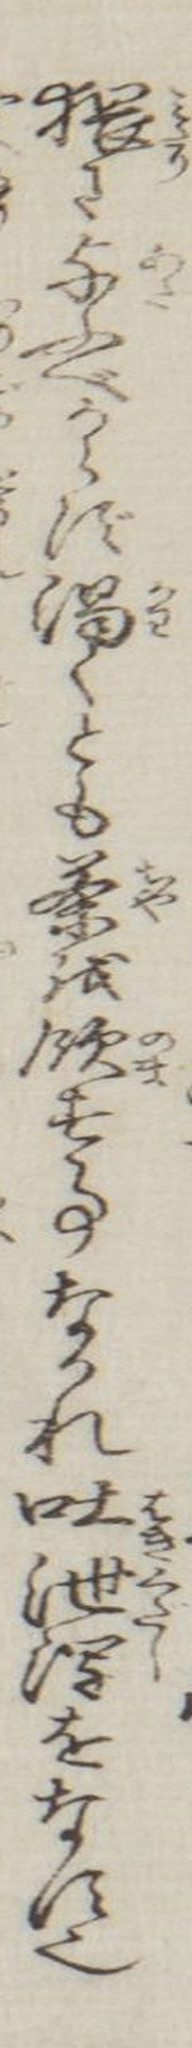猥に与ふべからず渇くとも茶を飲す事なかれ吐泄瀉をなす也
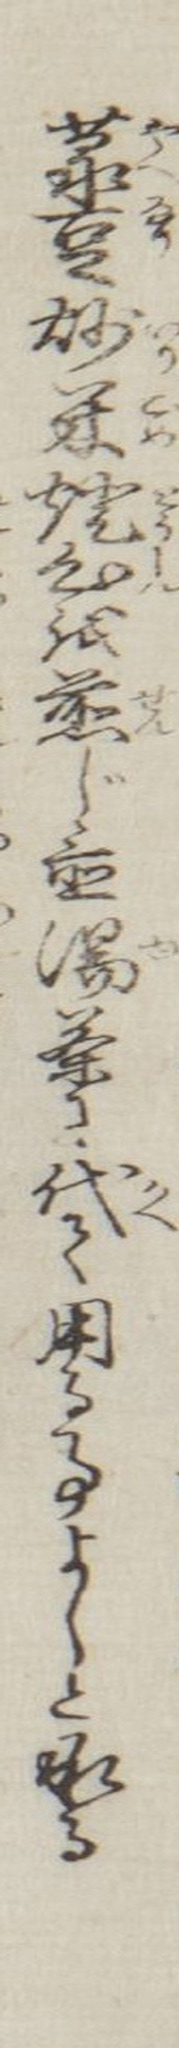菉豆炒米燈心を煎じ置湯茶に代て用る事よしと承る
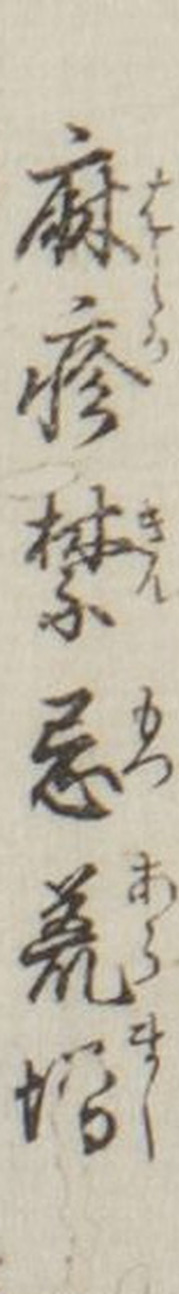麻疹禁忌荒増
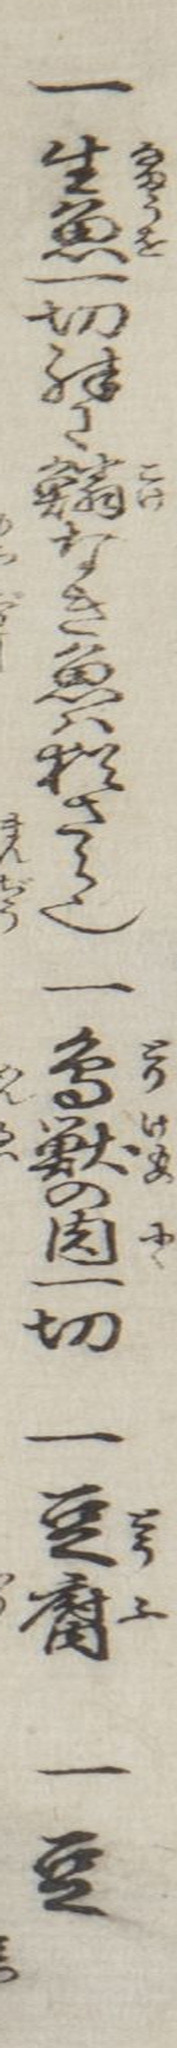一生魚一切殊に鱗なき魚は猶さら也一鳥獣の肉一切一豆腐一豆
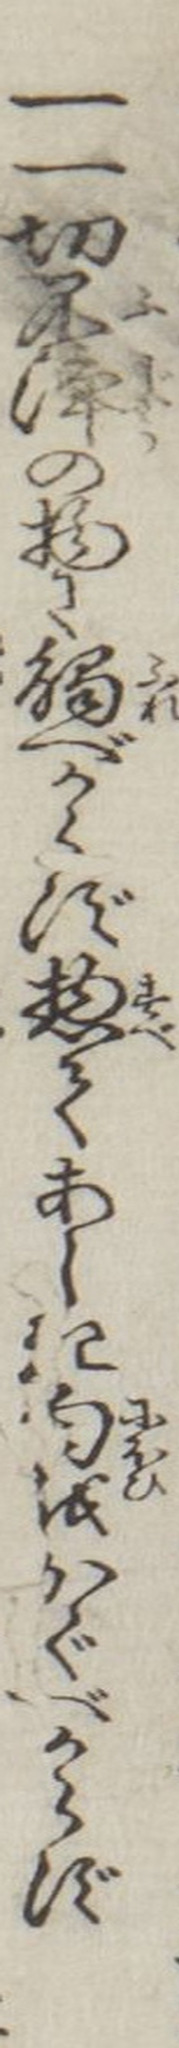一一切不浄の物に触べからず惣てあしき匂をかぐべからず
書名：痲疹養生法
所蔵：あいおいニッセイ同和損保株式会社
